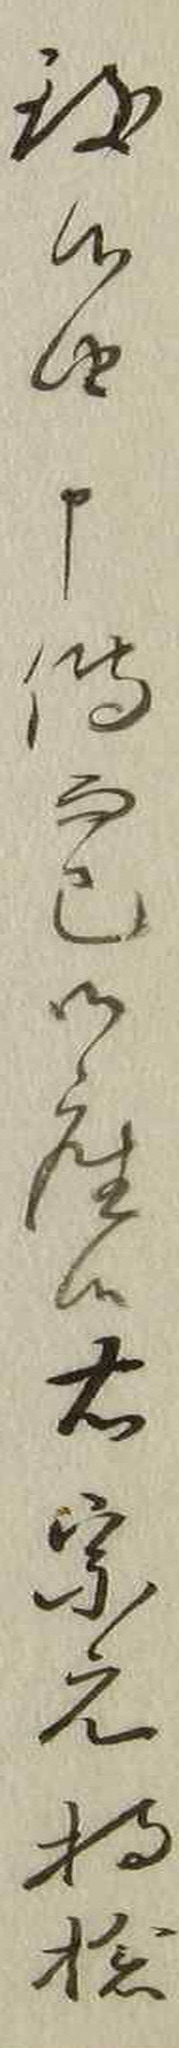致候由申伝而已御座候右宗元持槍
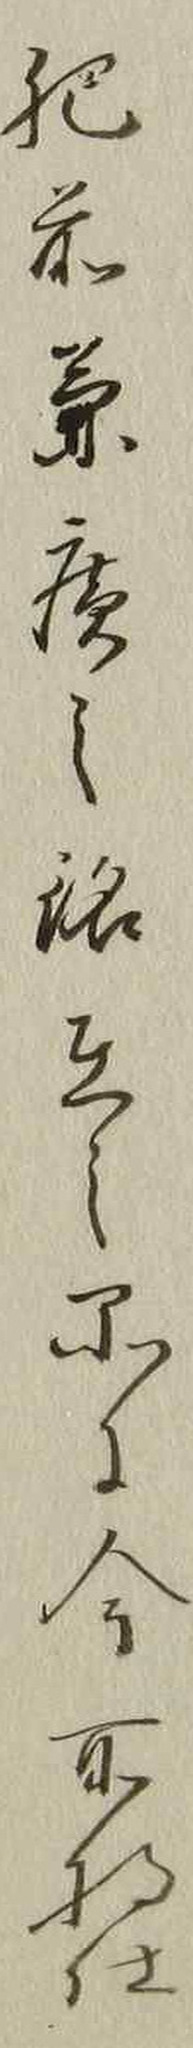肥前兼広之銘在之品に今所持仕
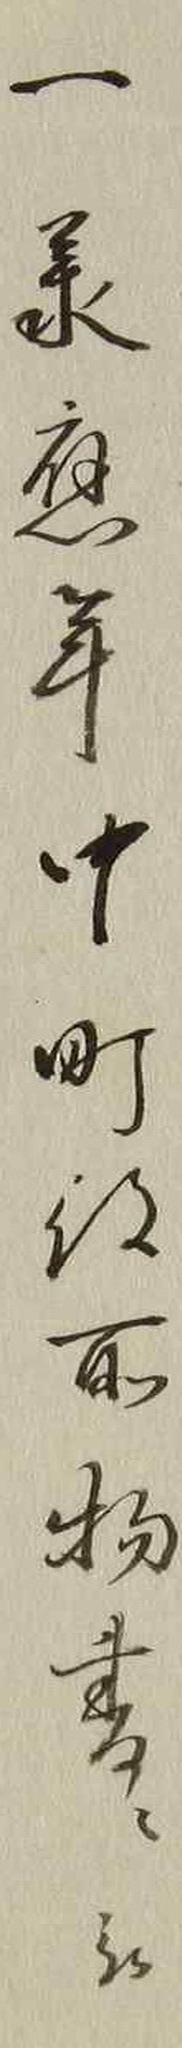一承応年中町役所物書ニ被
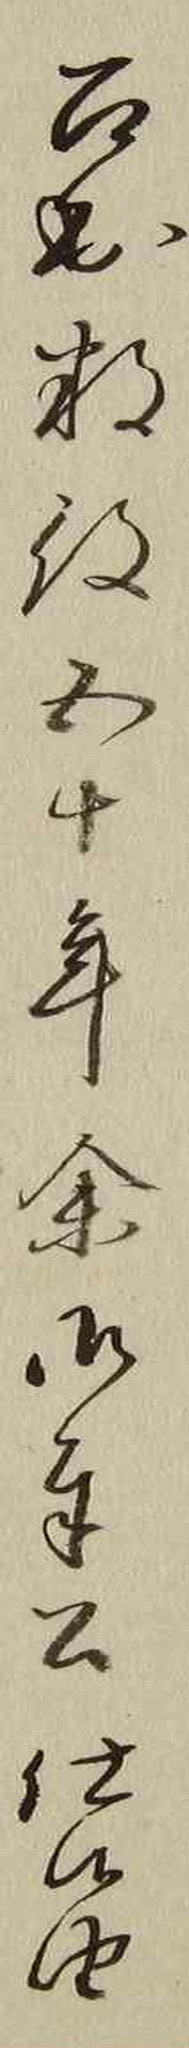召出数役五十年余御奉公仕候由
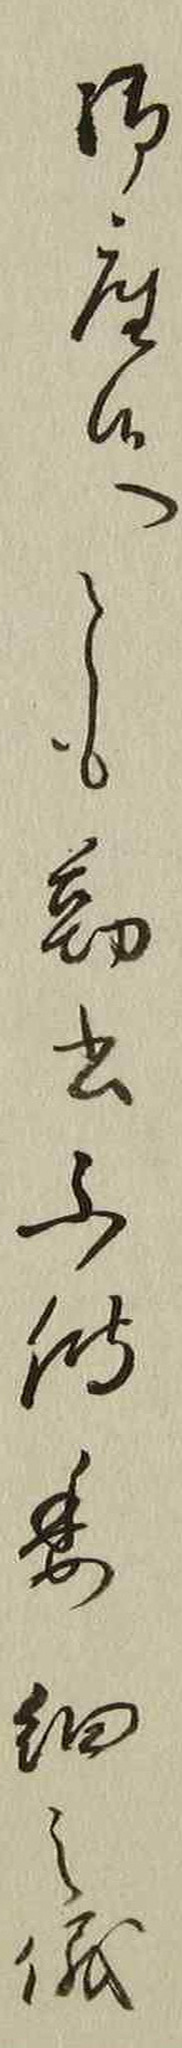御座候へとも勤書不伝委細之儀
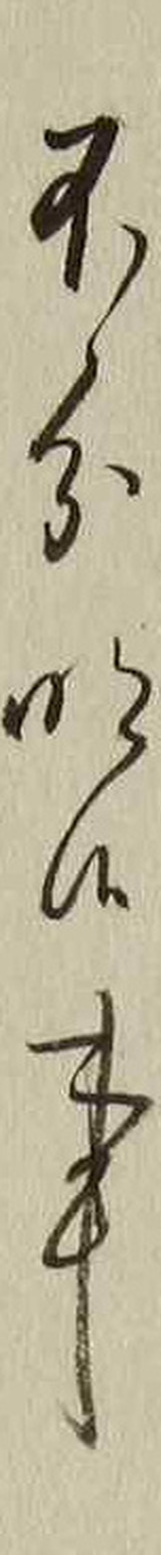不分明候事
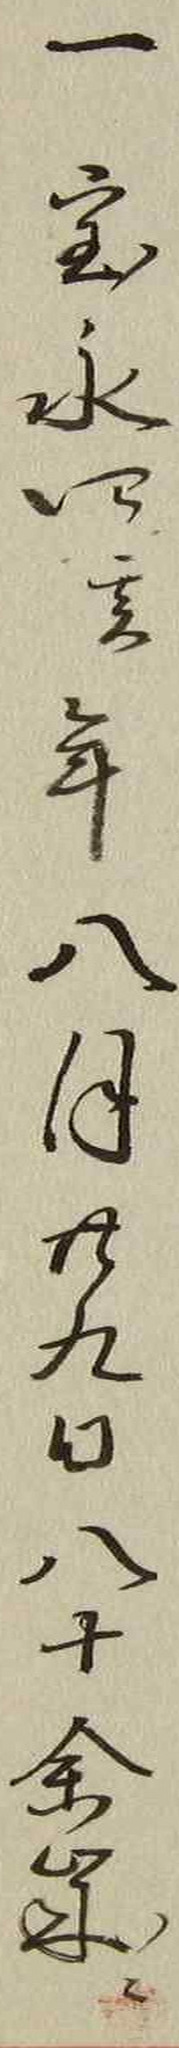一宝永四亥年八月廿九日八十余歳ニ
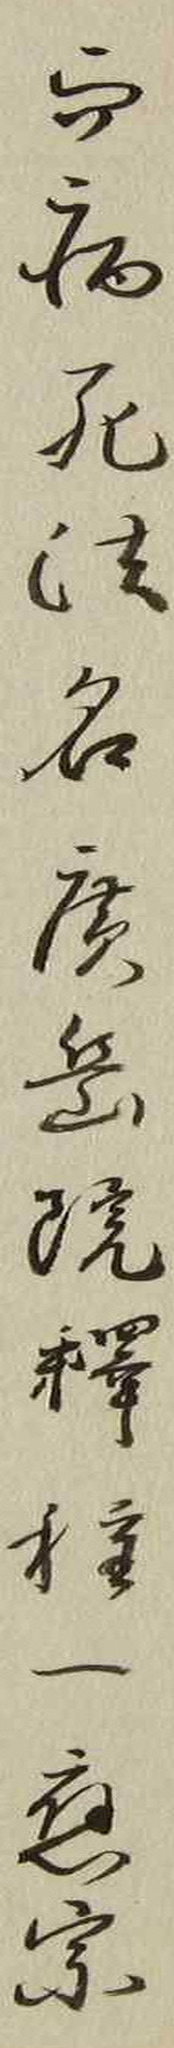而病死法名広岳院釈種一応宗
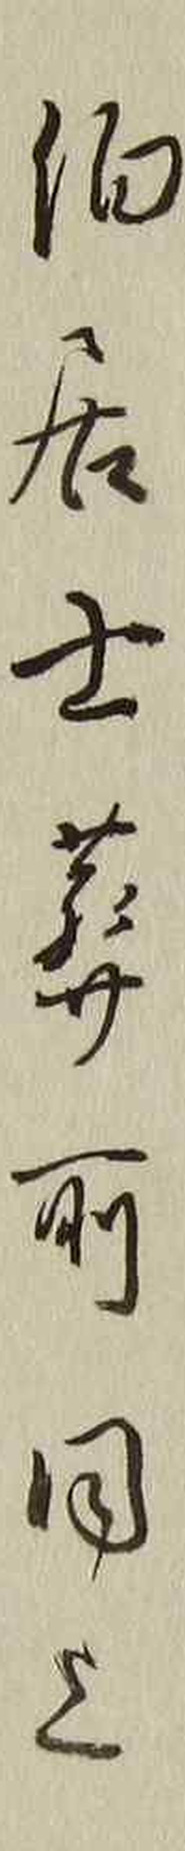伯居士葬所同上
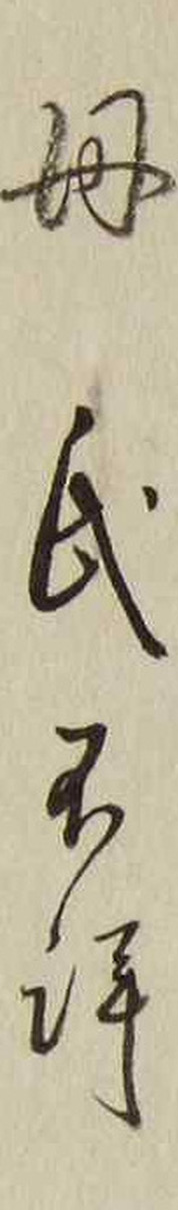母氏不詳

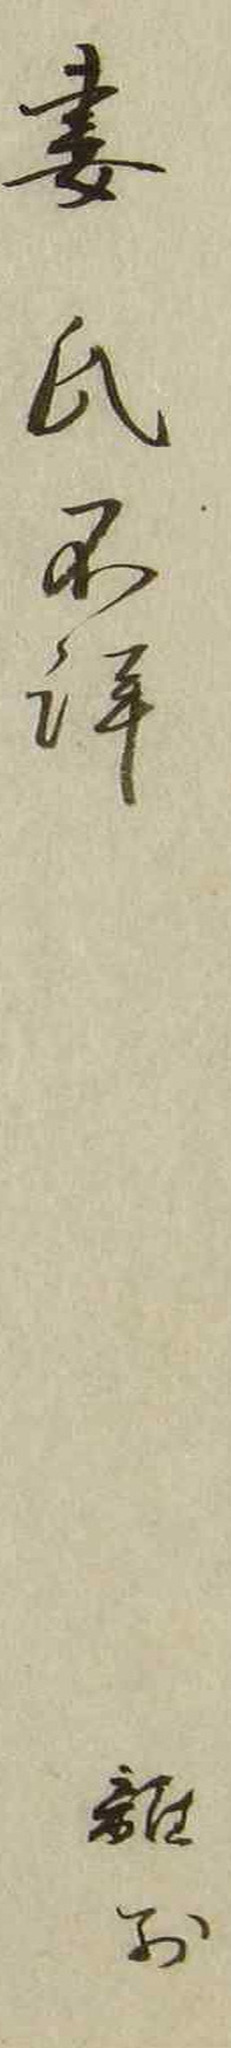妻氏不詳離別
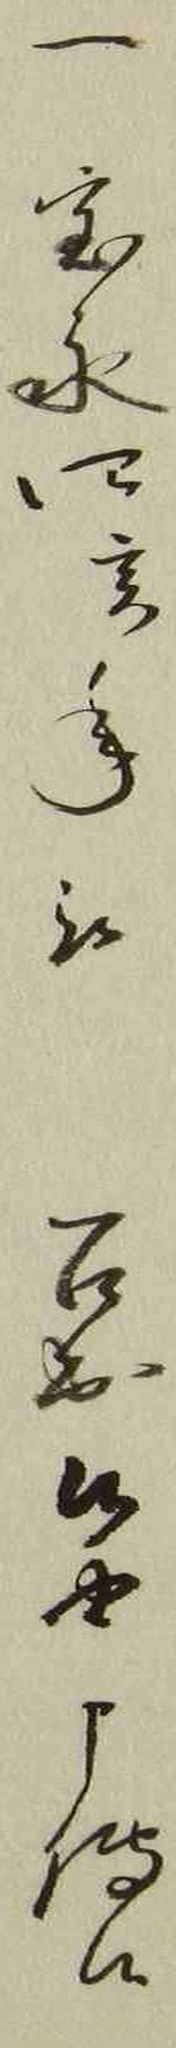一宝永四亥年被召出候由申伝候
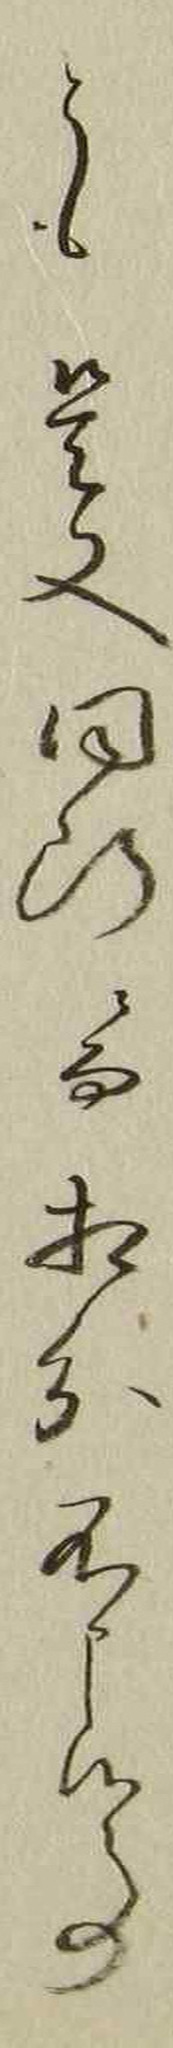とも是又同断ニ而相分不申候事
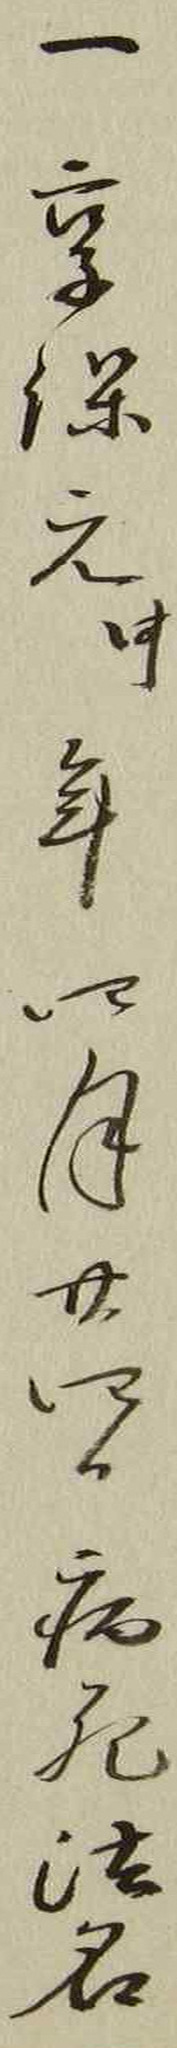一享保元申年四月廿四日病死法名
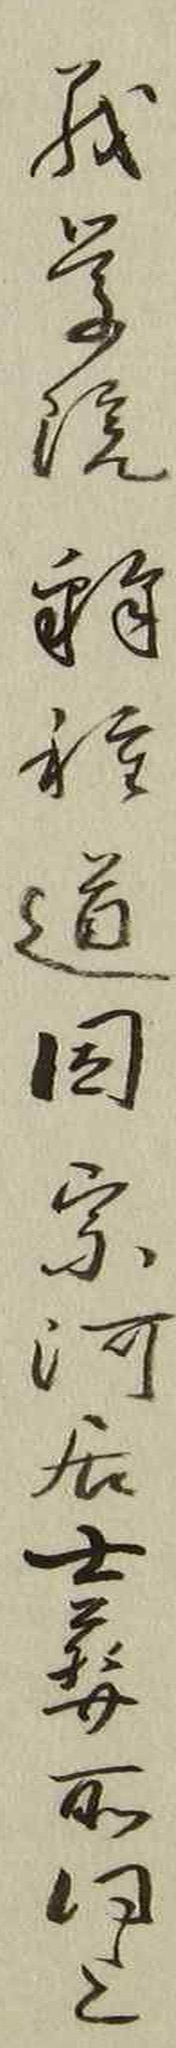義学院釈種道因宗河居士葬所同上
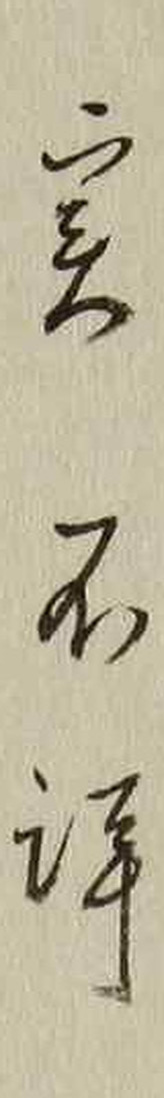実不詳
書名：諸士系譜　巻之8　い之部8
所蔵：会津若松市立会津図書館
